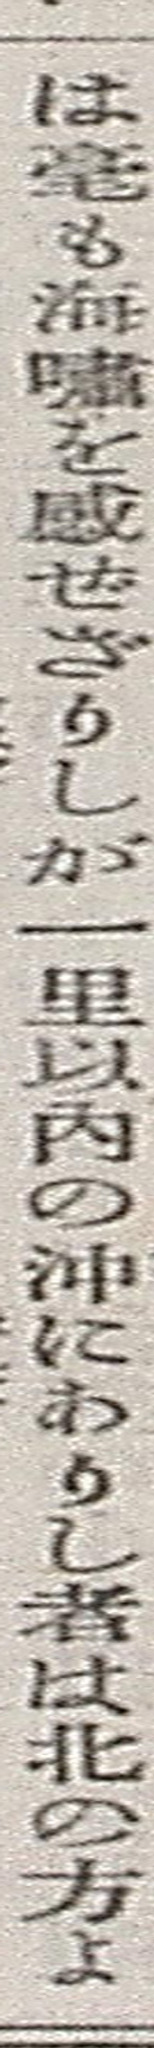は毫も海嘯を感ぜざりしが一里以内の沖にありし者は北の方よ
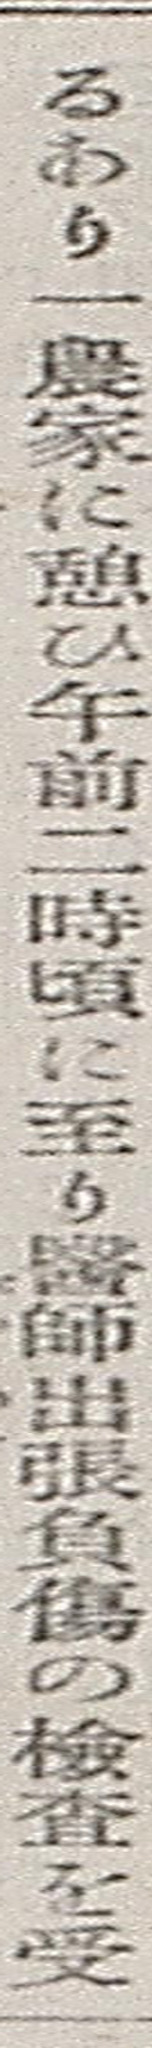るあり一農家に憩ひ午前二時頃に至り医師出張負傷の検査を受
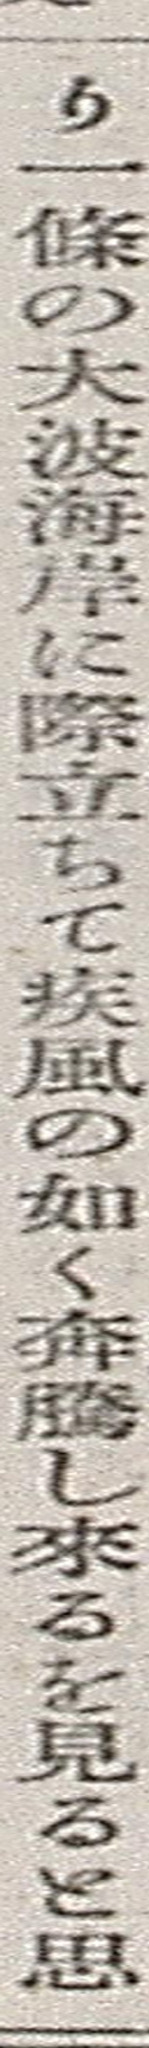り一条の大波海岸に際立ちて疾風の如く奔騰し来るを見ると思
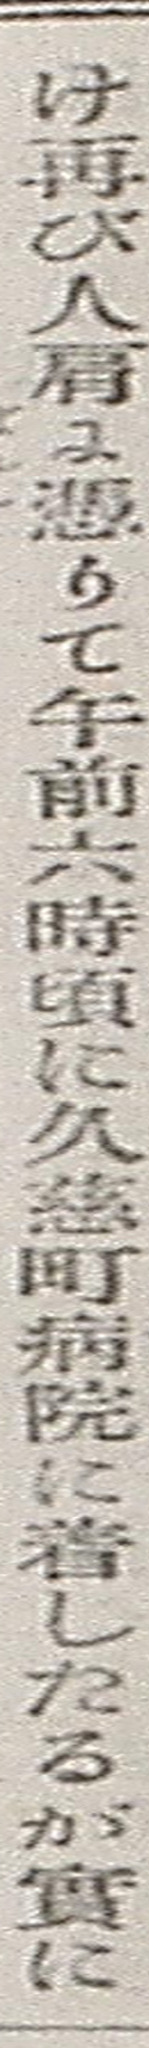け再び人肩に憑りて午前六時頃に久慈町病院に着したるが実に
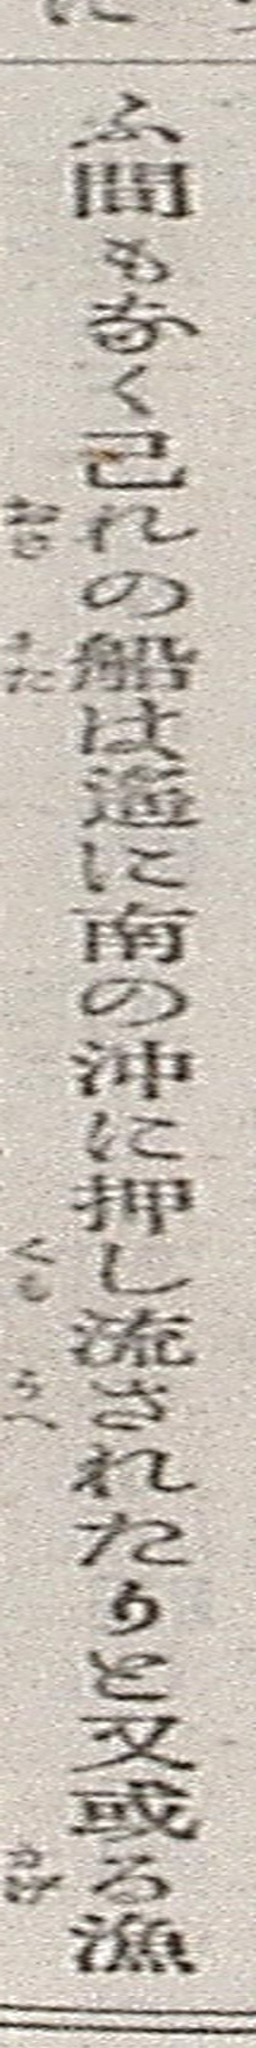ふ間もなく己れの船は遙に南の沖に押し流されたりと又或る漁
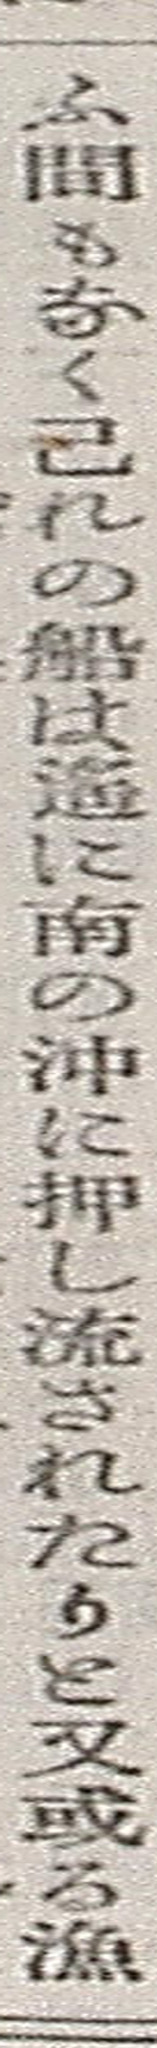ふ間もなく己れの船は遙に南の沖に押し流されたりと又或る漁
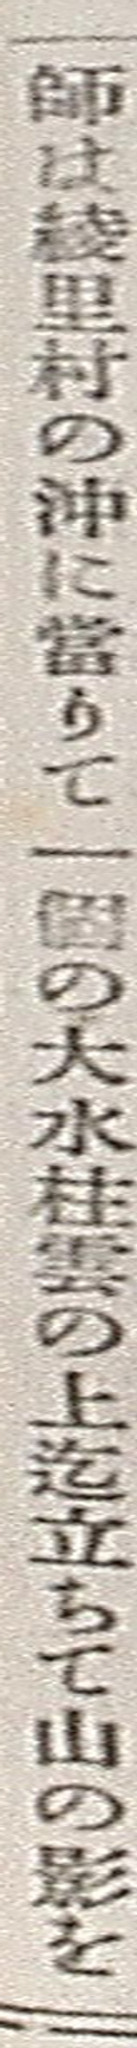師は綾里村の沖に当りて一個の大水柱雲の上迄立ちて山の影を

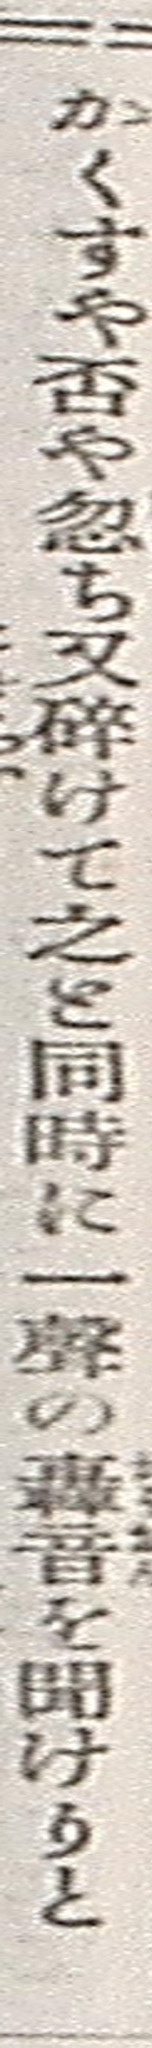かくすや否や忽ち又砕けて之と同時に一声の轟音を聞けりと
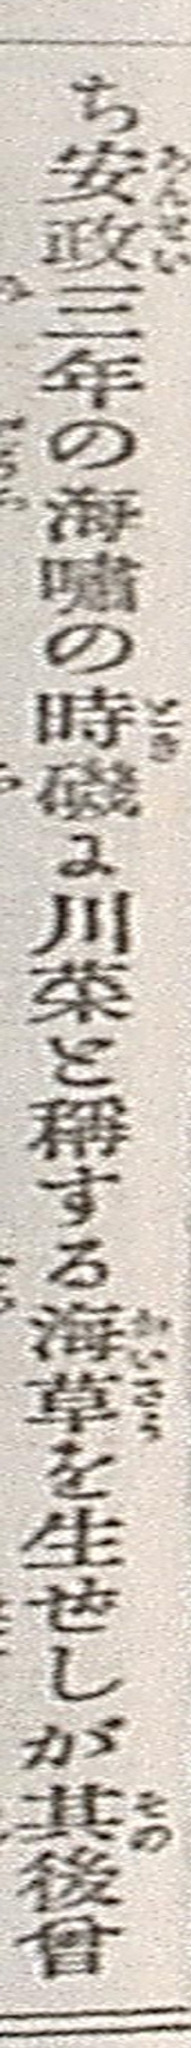ち安政三年の海嘯の時磯に川菜と称する海草を生ぜしが其後曾
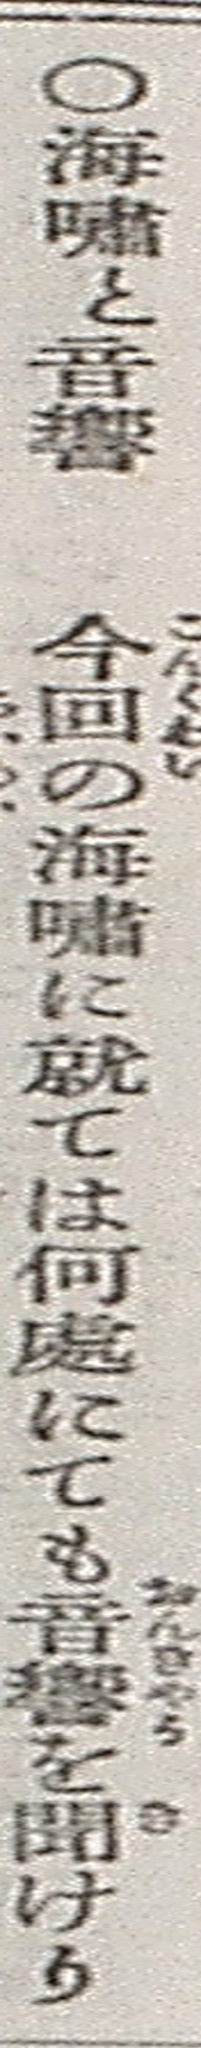○海嘯と音響今回の海嘯に就ては何処にても音響を聞けり
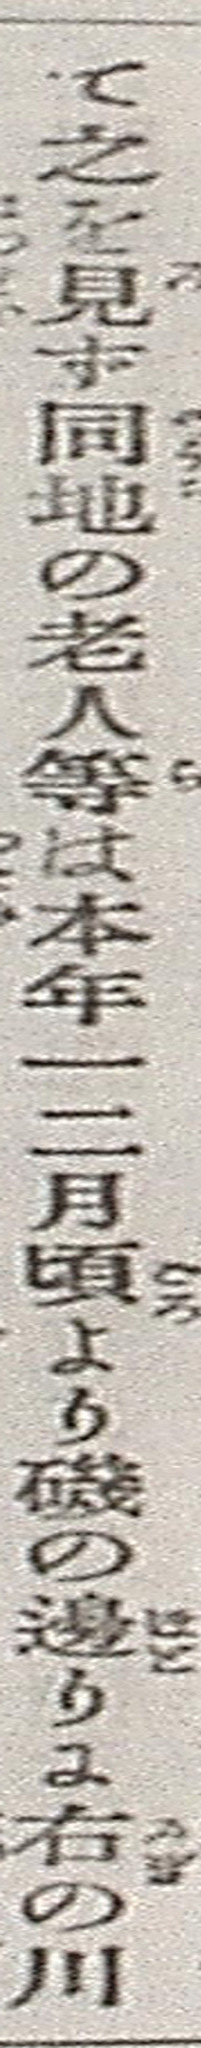て之を見ず同地の老人等は本年一二月頃より磯の辺りに右の川
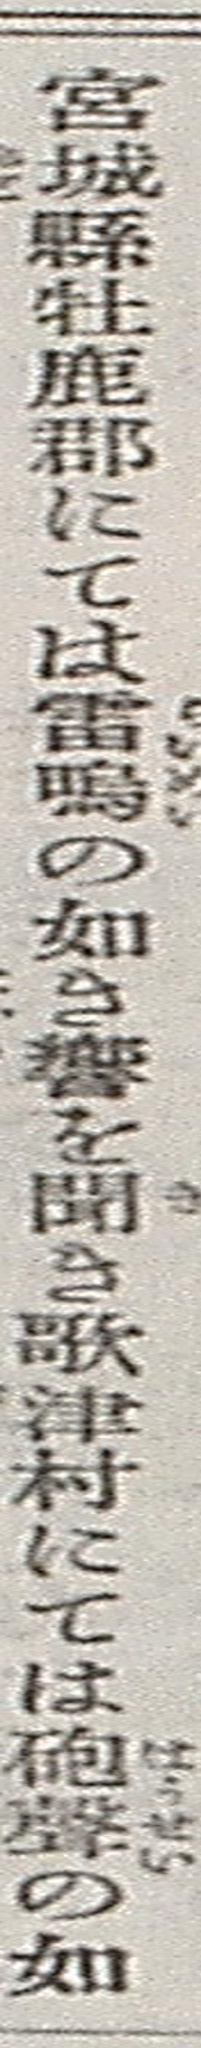宮城県牡鹿郡にては雷鳴の如き響を聞き歌津村にては砲声の如
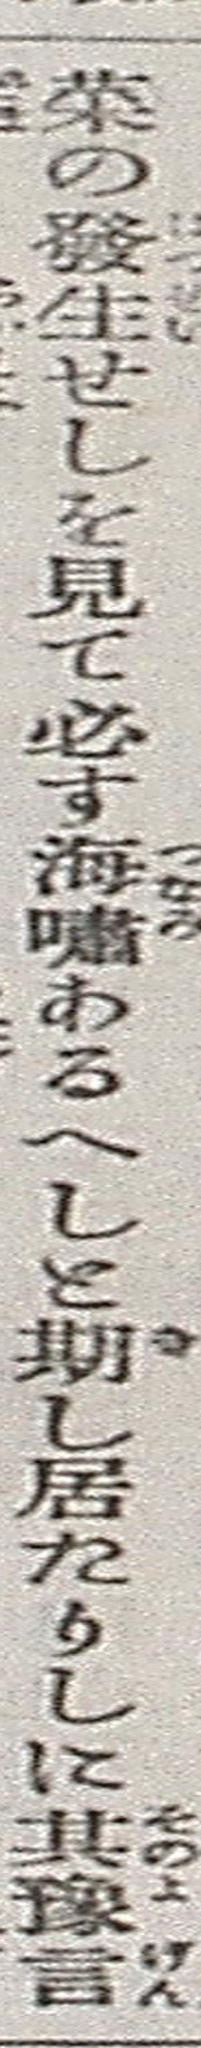菜の発生せしを見て必ず海嘯あるへしと期し居たりしに其予言
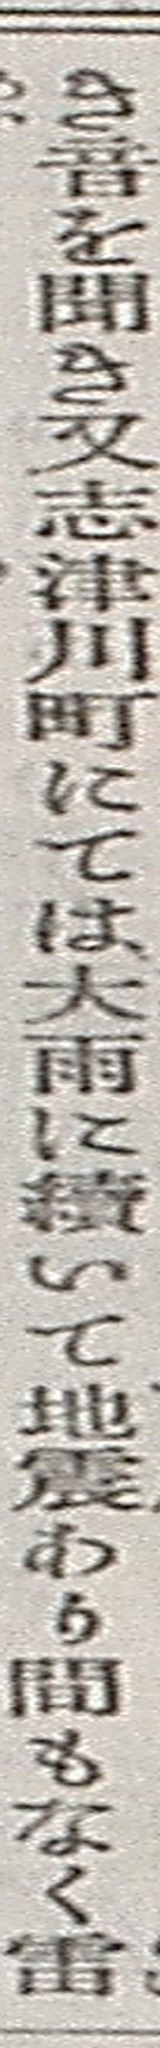き音を聞き又志津川町にては大雨に続いて地震あり間もなく雷
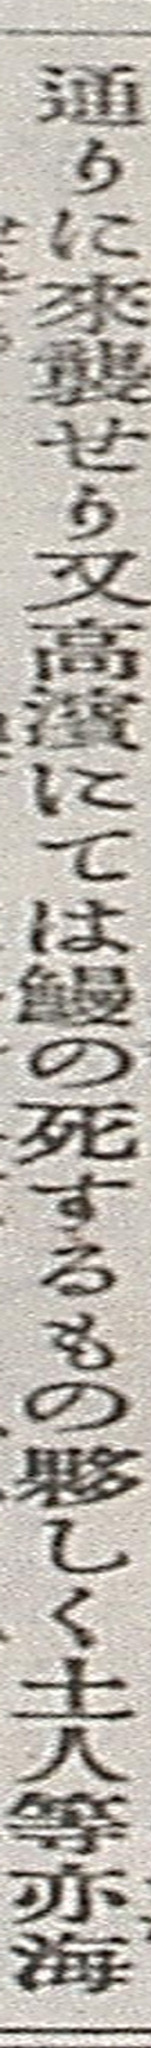通りに来襲せり又高浜にては鰻の死するもの夥しく土人等亦海
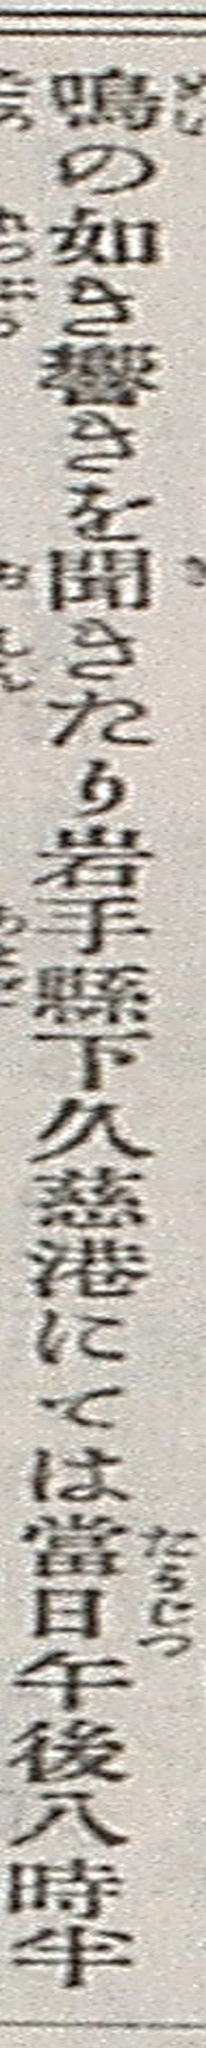鳴の如き響きを聞きたり岩手県下久慈港にては当日午後八時半
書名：風俗畫報臨時増刊第百二十號　大海嘯被害録（下）
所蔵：東京大学地震研究所図書室 Earthquake Research Institute Library, The University of Tokyo, JAPAN
